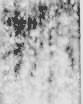昜（陽）
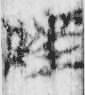陵
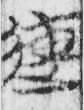連
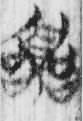囂
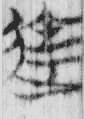達
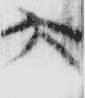大
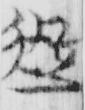○（卜）
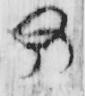尹
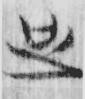足
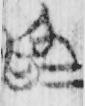爲
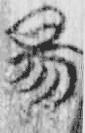昜（陽）
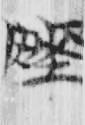陵
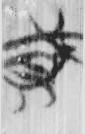貸
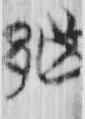○（越）
